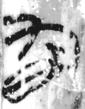旬
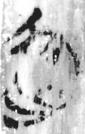○（屈）
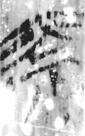○（夕）
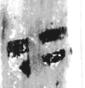二
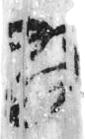旬
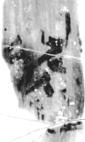遠
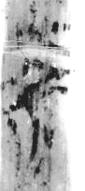○（夕）
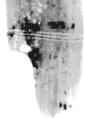內（入）
